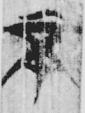不
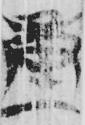量
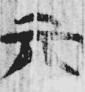亓（其）
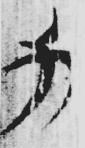力
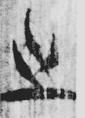之
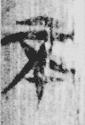不
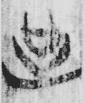足
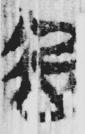○（起）
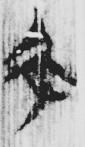帀（師）
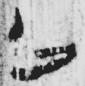㠯（以）
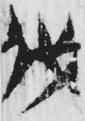伐
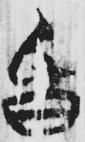昏（岷）
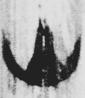山
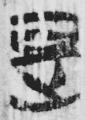是（氏）
